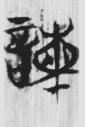諫
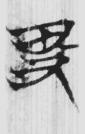卑
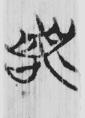若
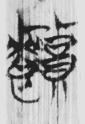{來㿝貴}
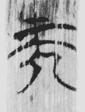而
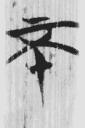不
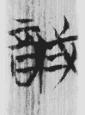{酉戌}
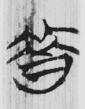昔
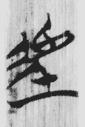𫊟
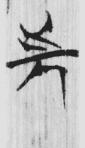先
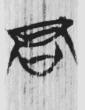君
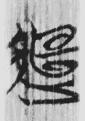{辶亘}
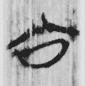公
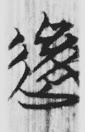後
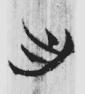出
